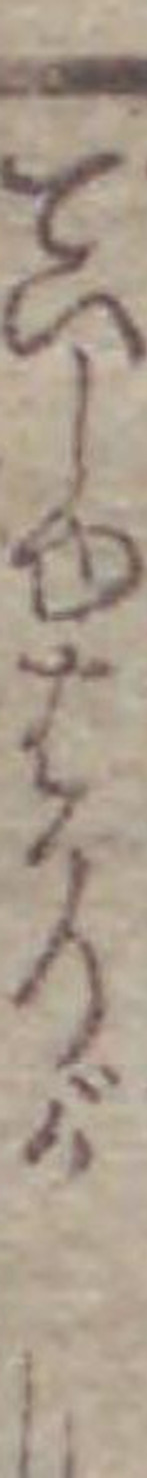ていしゆはかりが
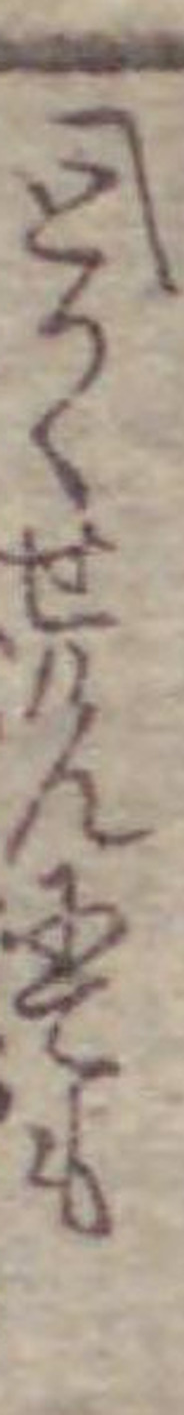〽とかくせけんにても
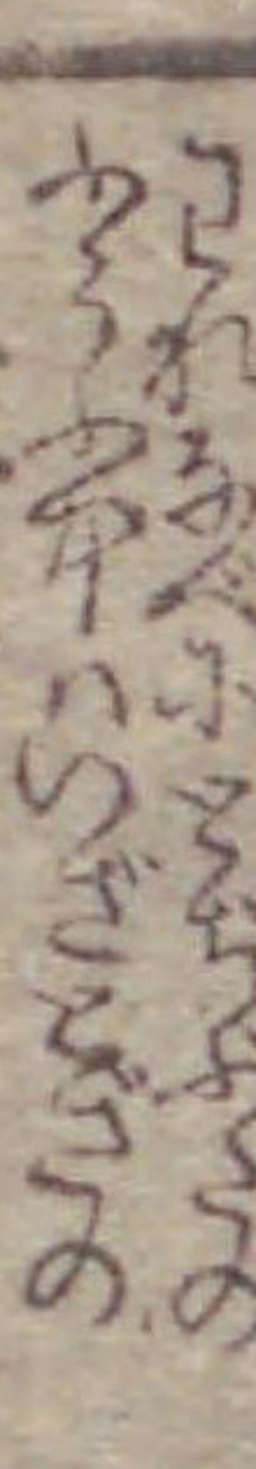ふうふ中はいざこざの

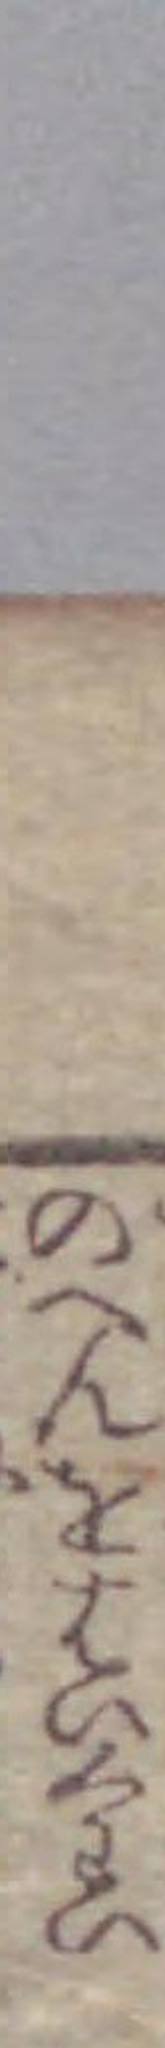のへんをはいくわい
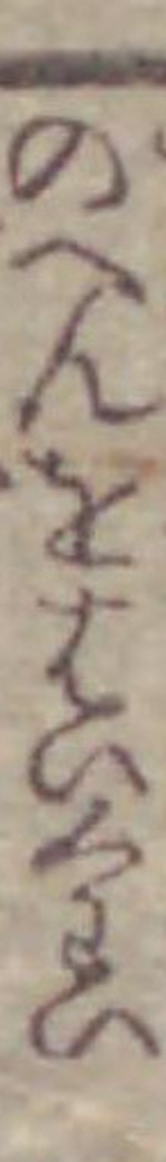のへんをはいくわい
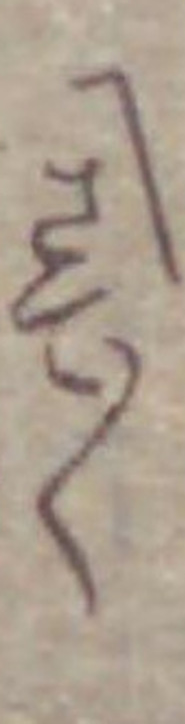〽さて〳〵
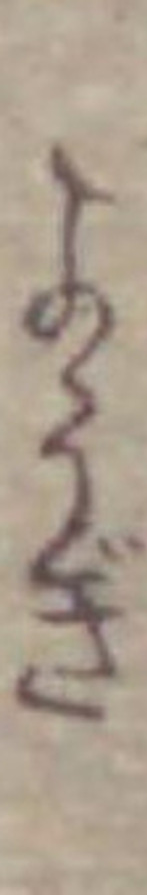ようぎ
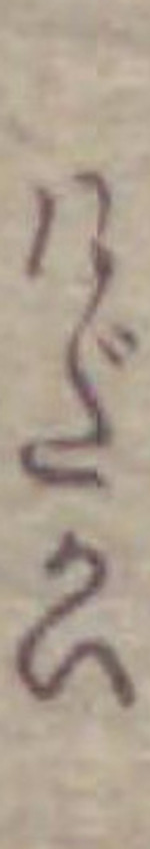けだかい
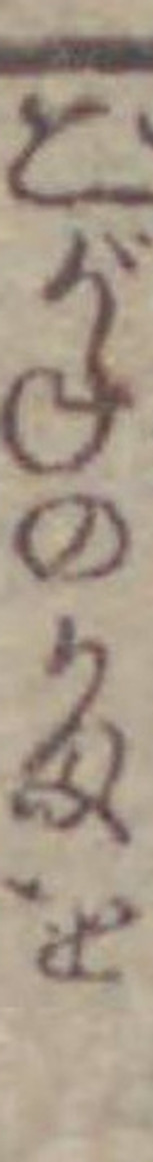こがねのかまを
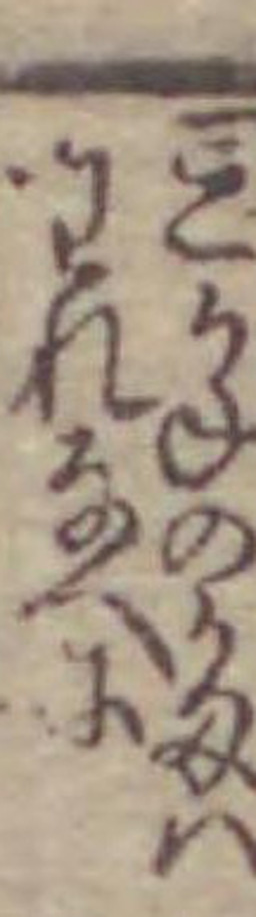われなへに
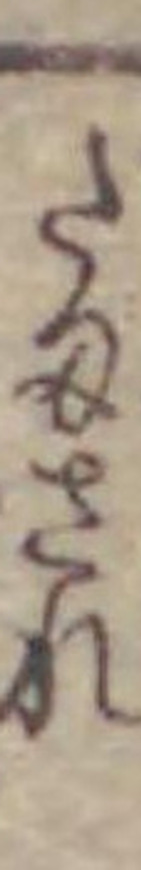だまされ
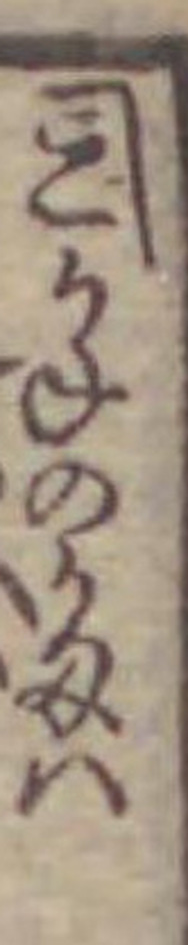〽こかねのかまは
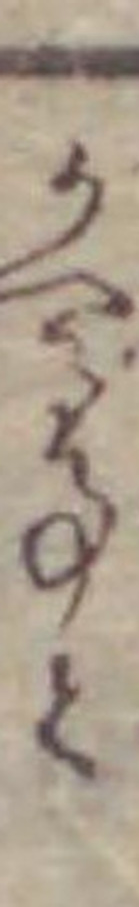かへる事と
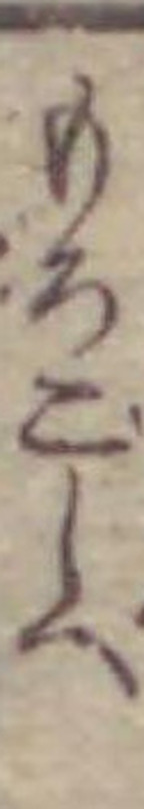もろこしへ
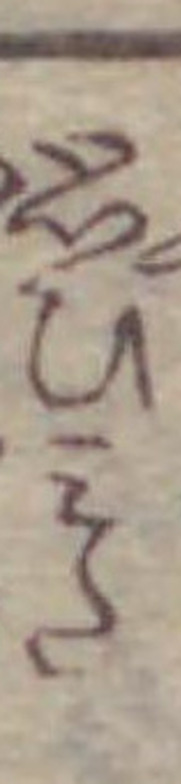思ひみた
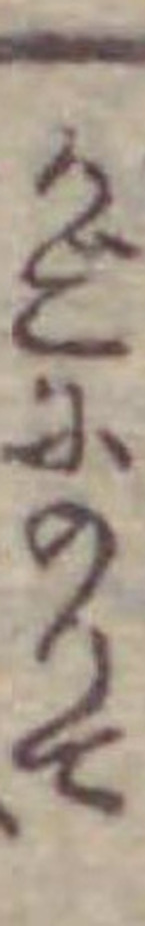かごにのりて
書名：万物小遣帳 : 2巻
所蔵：国立国会図書館 National Diet Library, JAPAN
